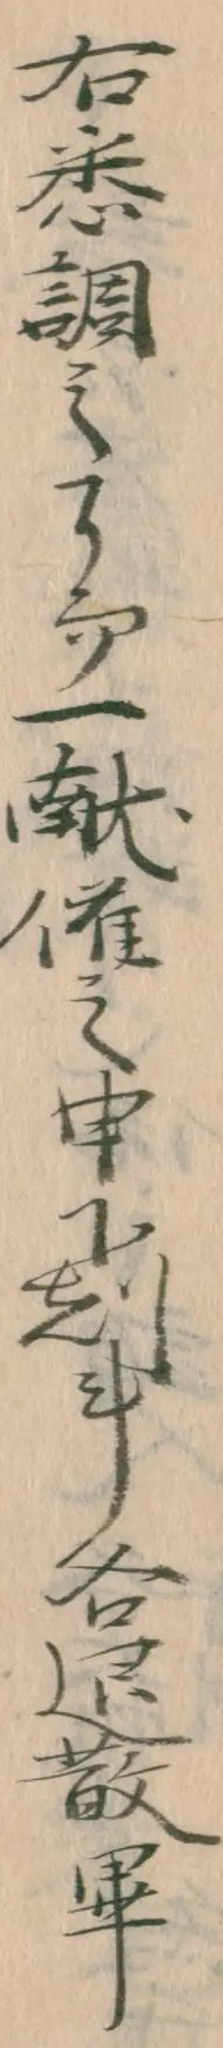右悉調之了而一献催之申下刻斗各退散畢
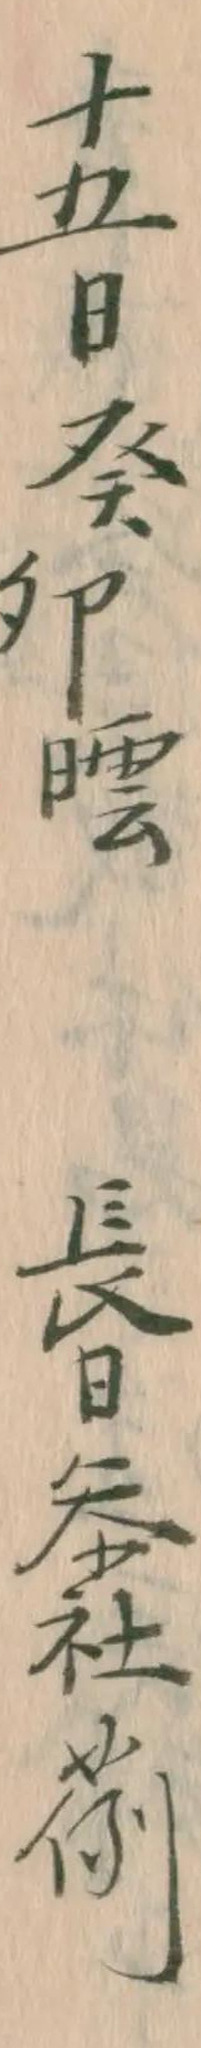十五日癸卯曇長日参社如例
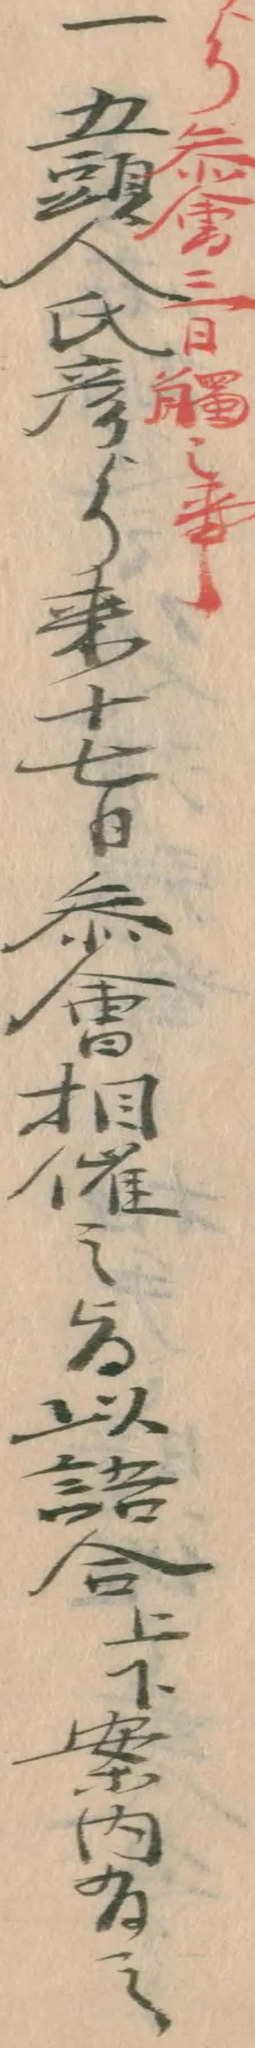一五頭人氏彦より来十七日参會相催之旨以語合上下案内有之
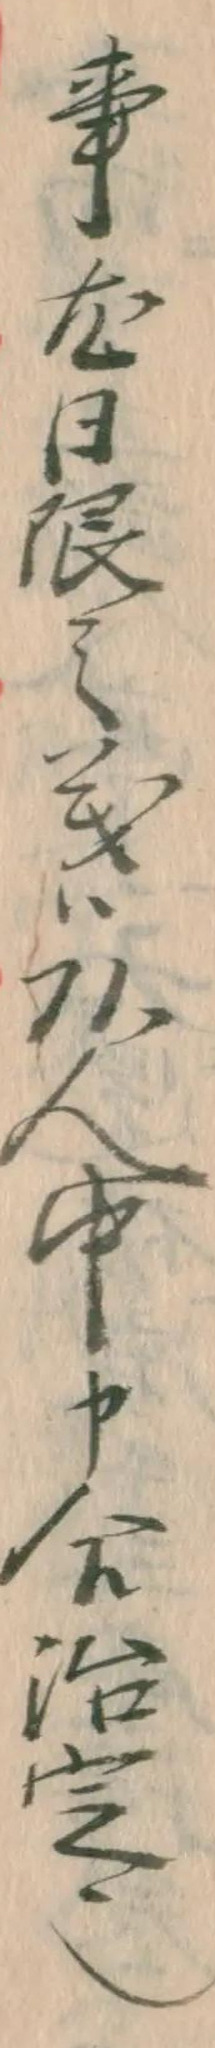事尤日限之義ハ頭人中申合治定也
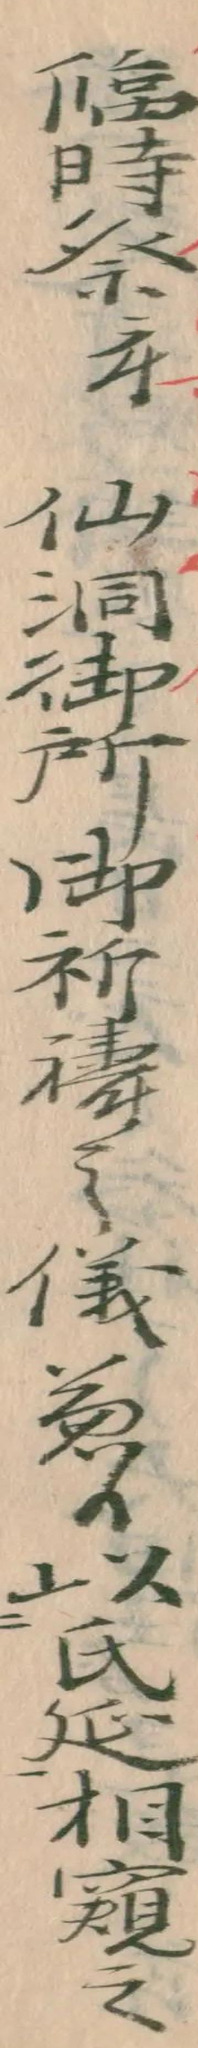一臨時祭ニ付仙洞御所御祈祷之儀兼日以氏延相窺之
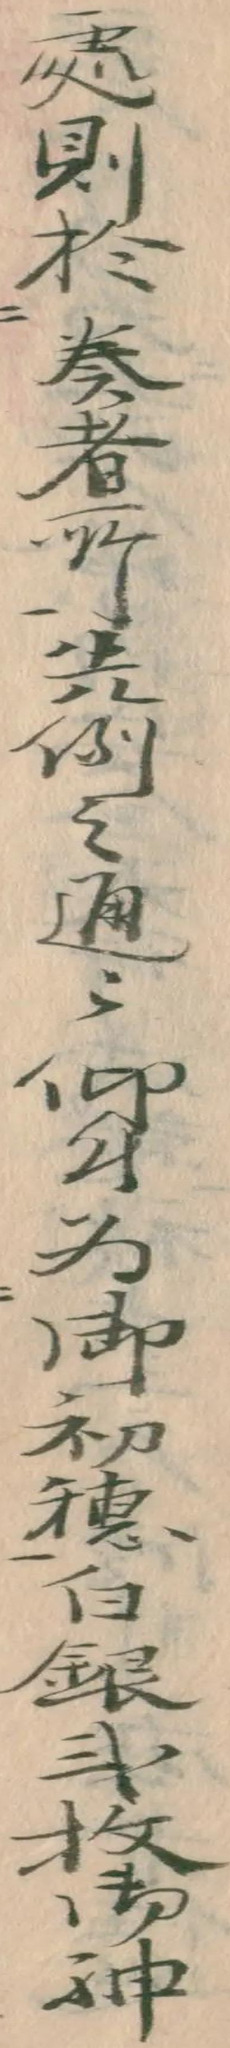處則於奏者所先例之通被仰付為御初穂白銀弐枚御神
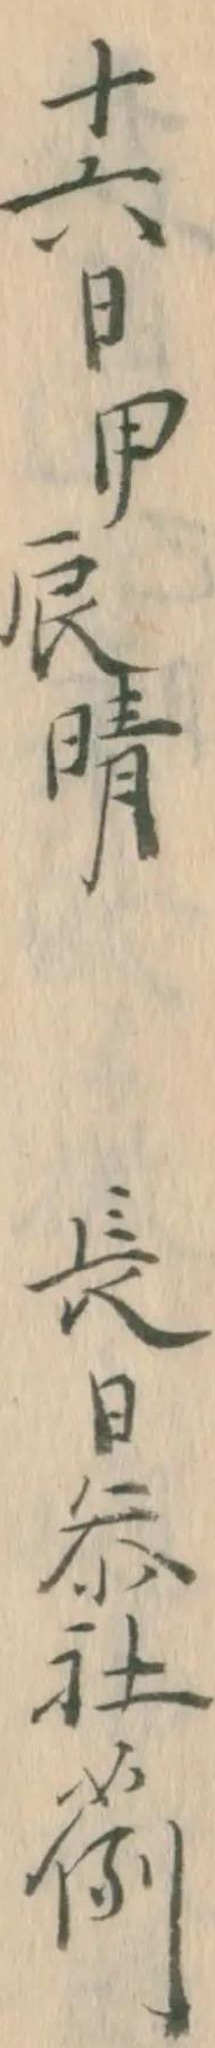十六日甲辰晴長日参社如例

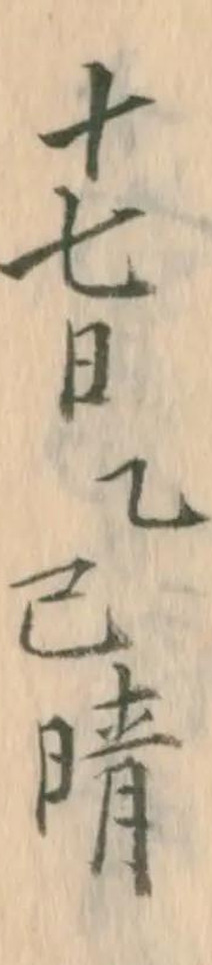十七日乙巳晴
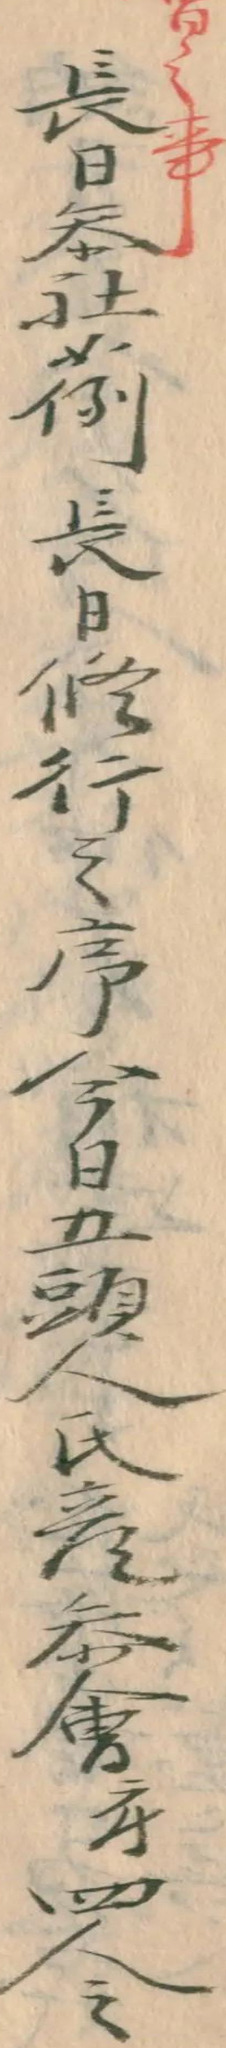一長日参社如例長日修行之序今日五頭人氏彦参會ニ付四人令
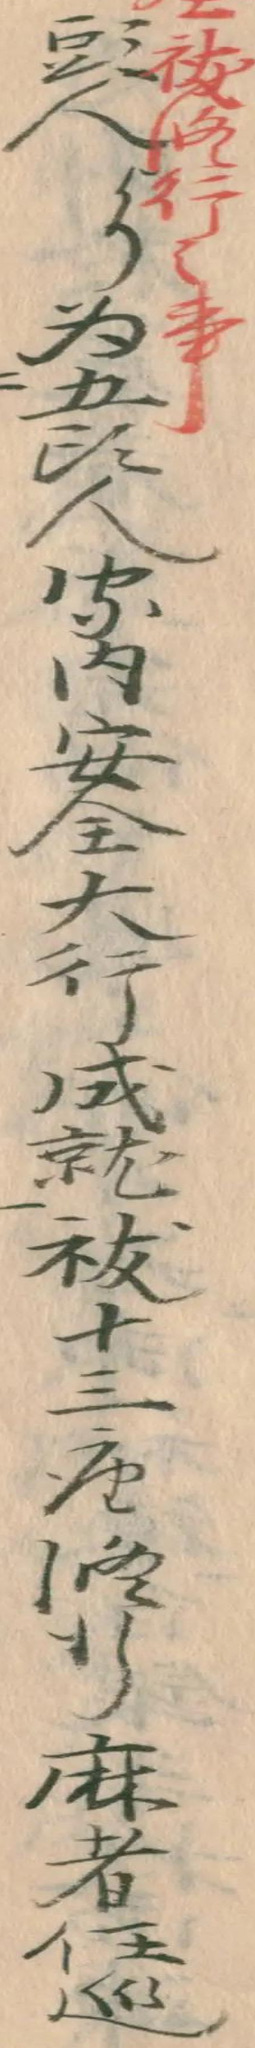頭人より為五頭人家内安全大行成就祓十三座修行麻者任巡
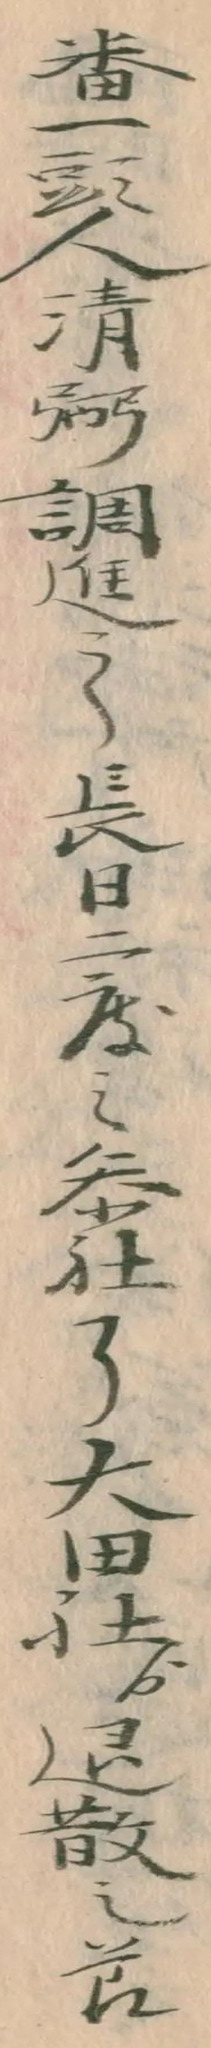番一頭人清弼調進之長日二度之参社了大田社ゟ退散之節
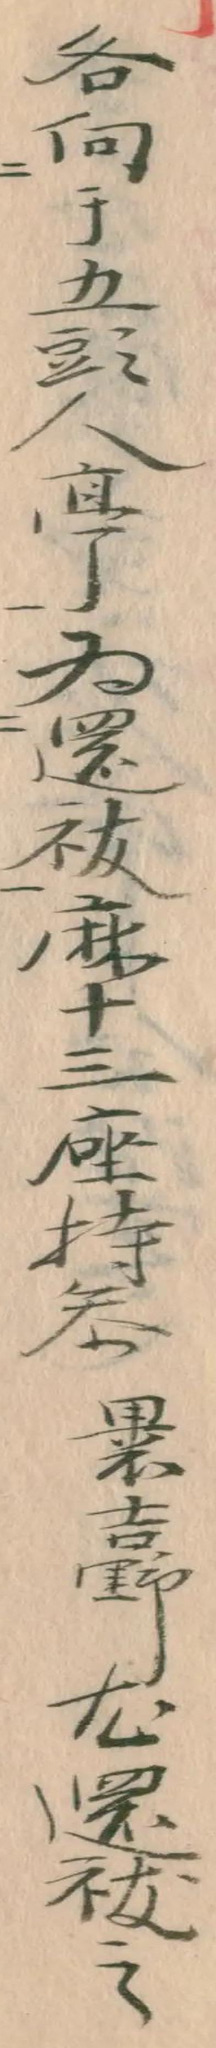各向于五頭人亭為還祓麻十三座持参褁吉野尤還祓之
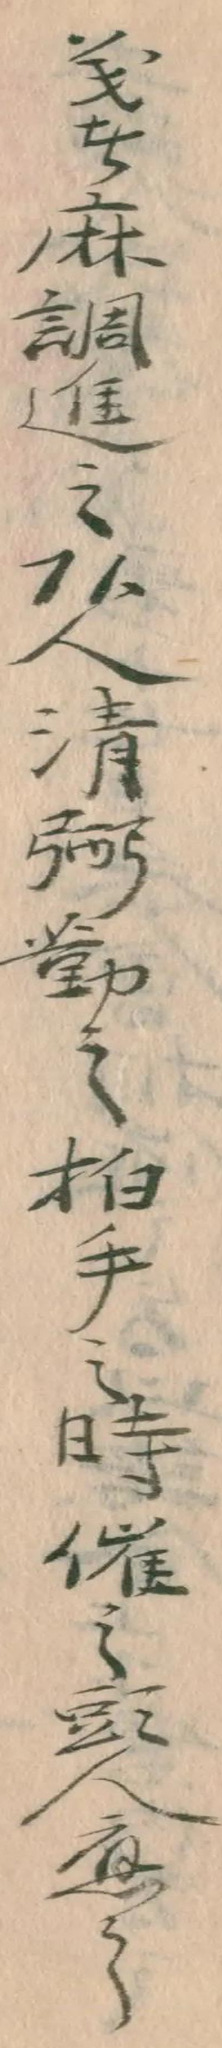義は麻調進之頭人清弼勤之拍手之時催之頭應也
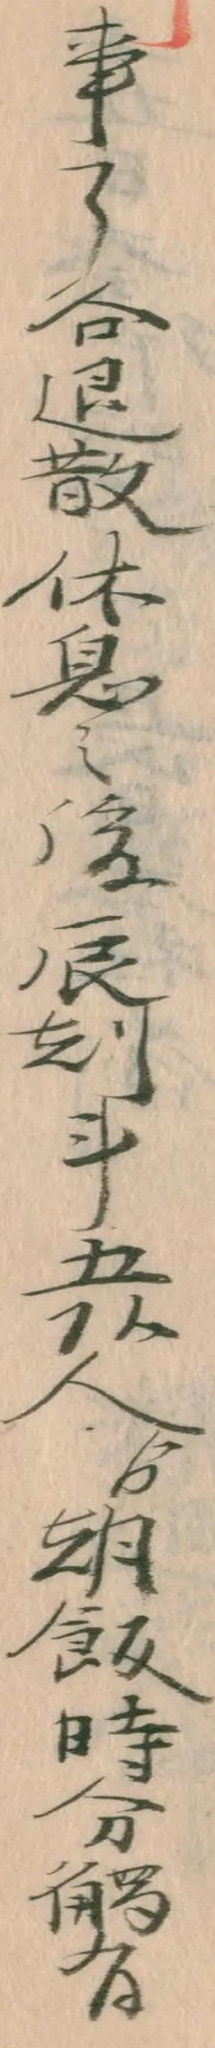事了各退散休息之後辰刻斗五頭人ゟ朝飯時分觸有
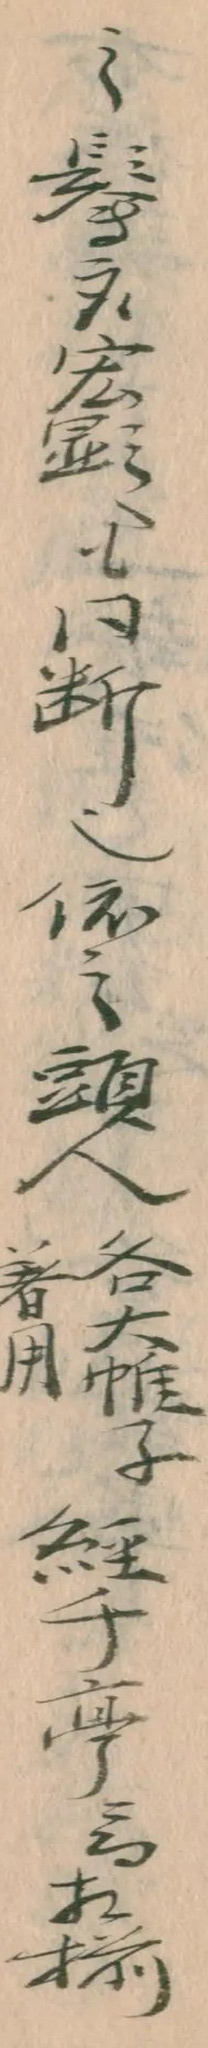之鬠取宏顕へも同断也依之頭人各大帷子着用経千亭ニ而相揃
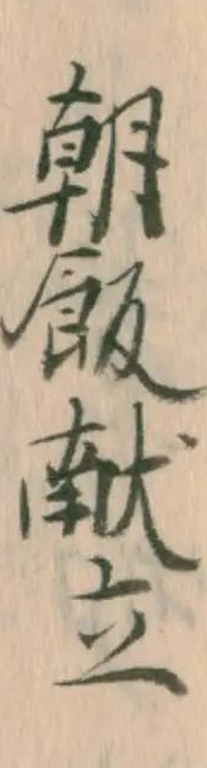朝飯献立
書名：賀茂社記録. 第74冊
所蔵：国立国会図書館 National Diet Library, JAPAN
